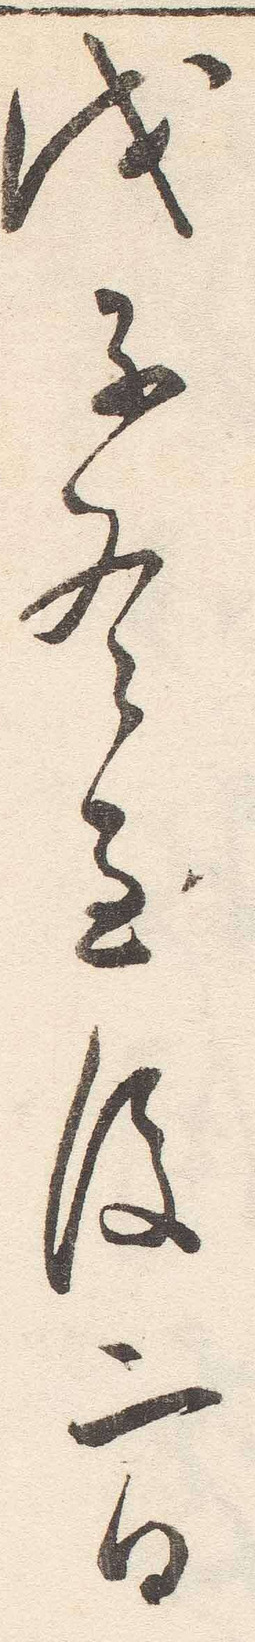戊子冬至後二日
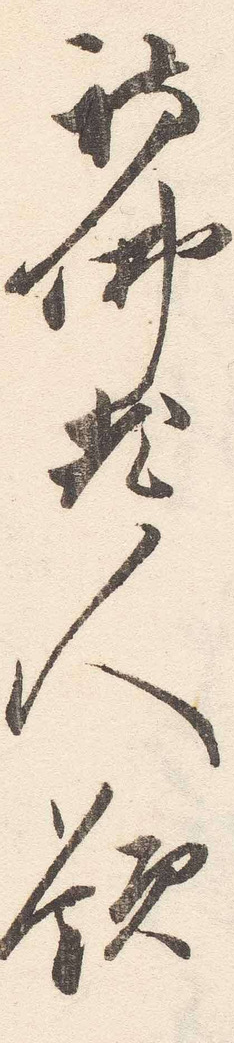詩佛老人題
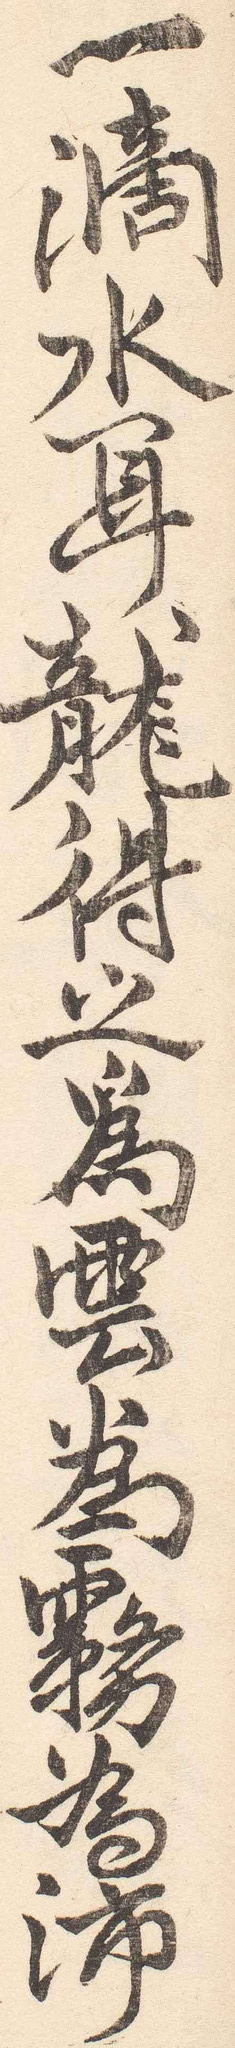一滴水耳龍得之為雲為霧為沛
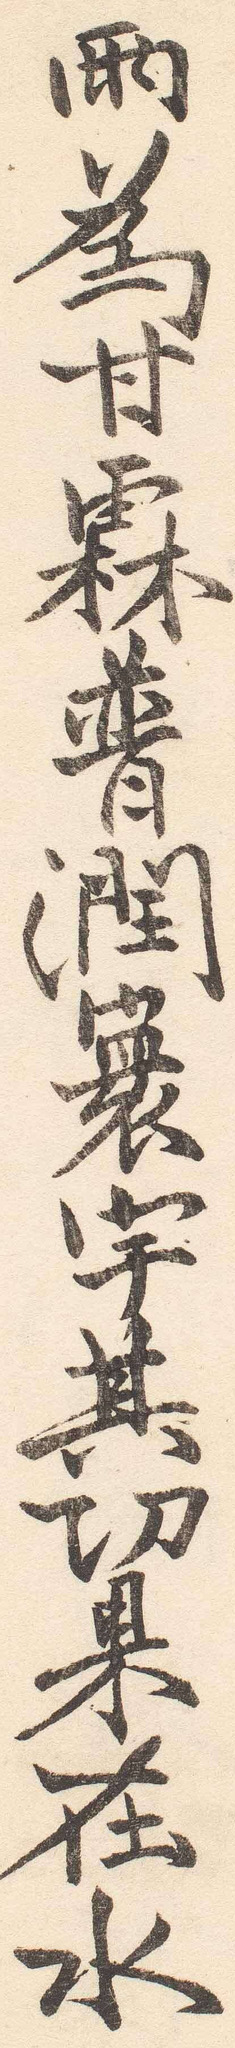雨為甘霖普潤寰宇其功果在水
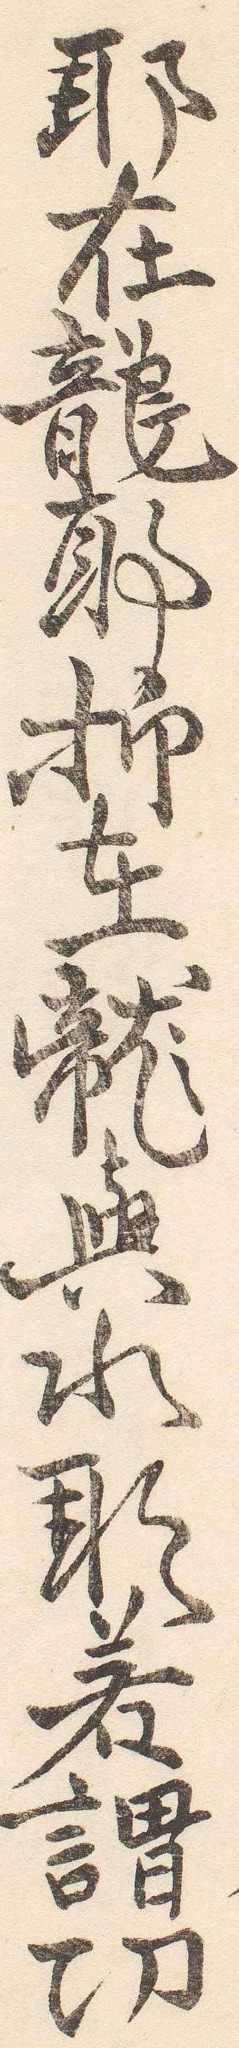耶在龍耶抑在龍與水耶若謂功
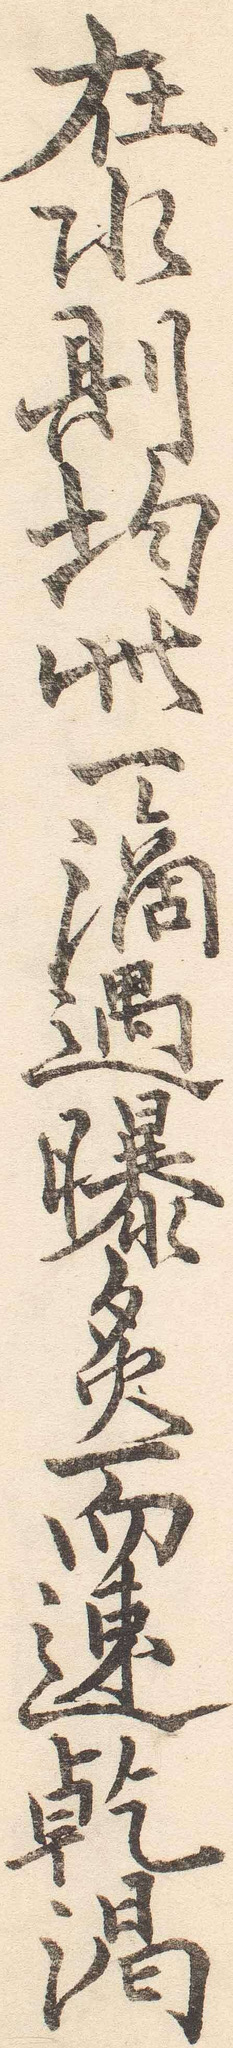在水則均此一滴遇曝炙而速乾渇
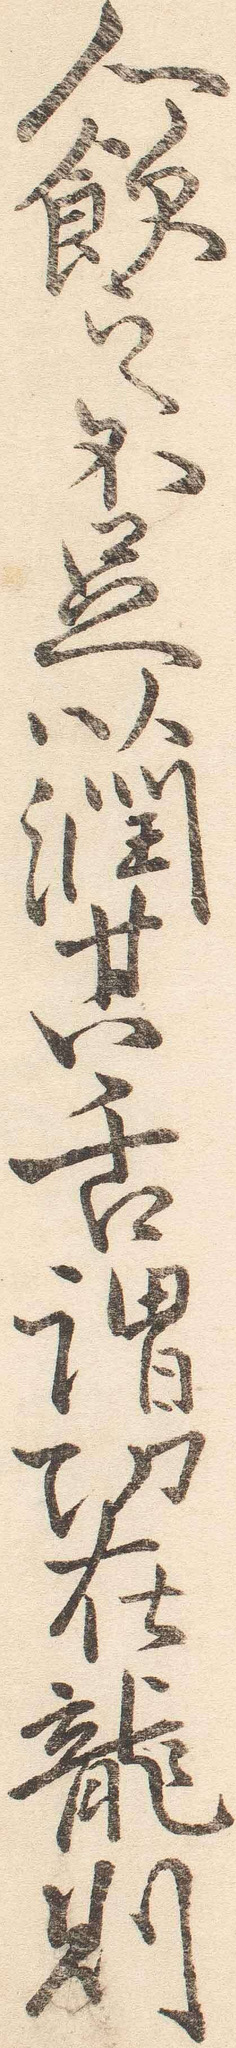人飲之不足以潤其舌謂功在龍則
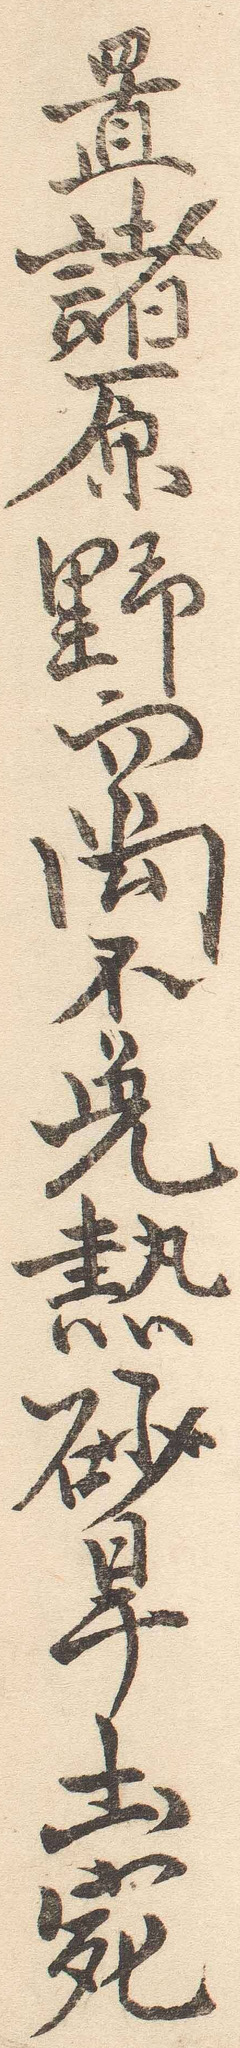置諸原野而尚不免熱砂旱土宛

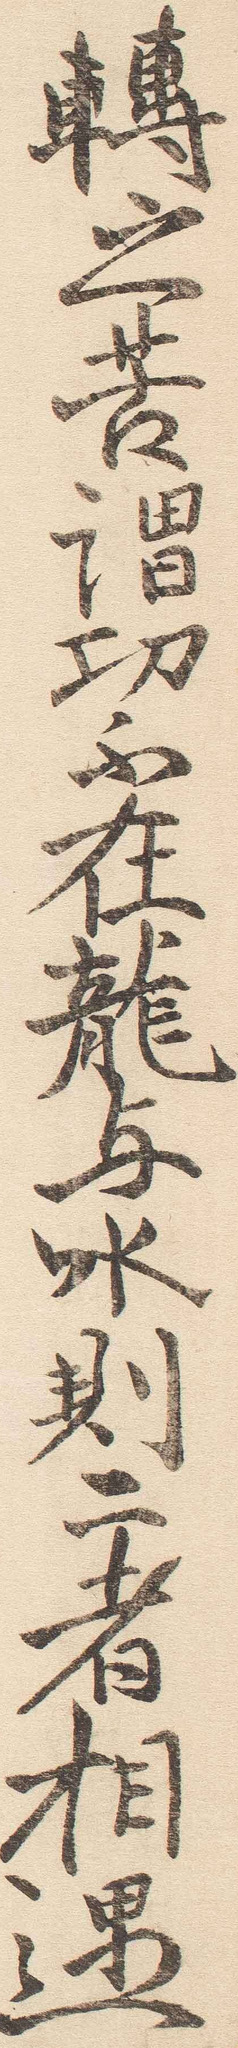転之苦謂功不在龍与水則二者相遇
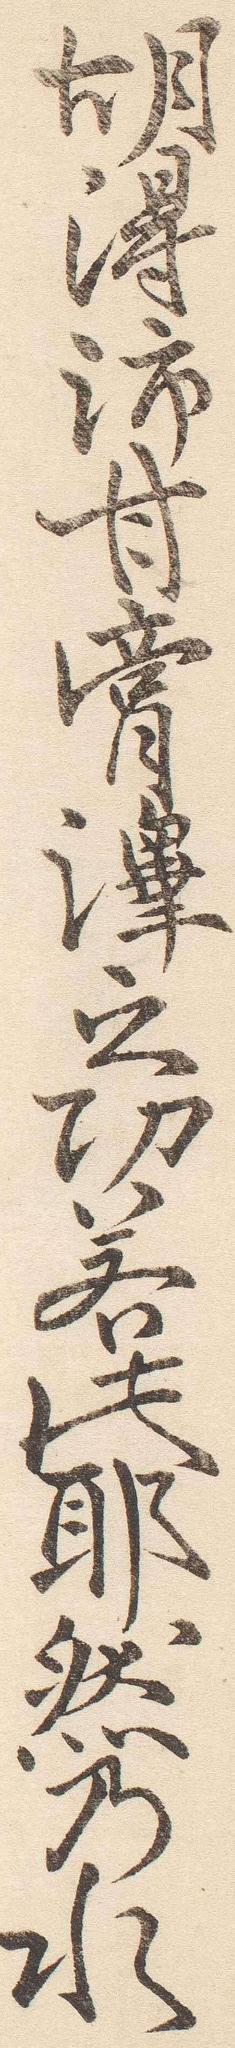胡得沛甘膏澤之功若此耶然乃水
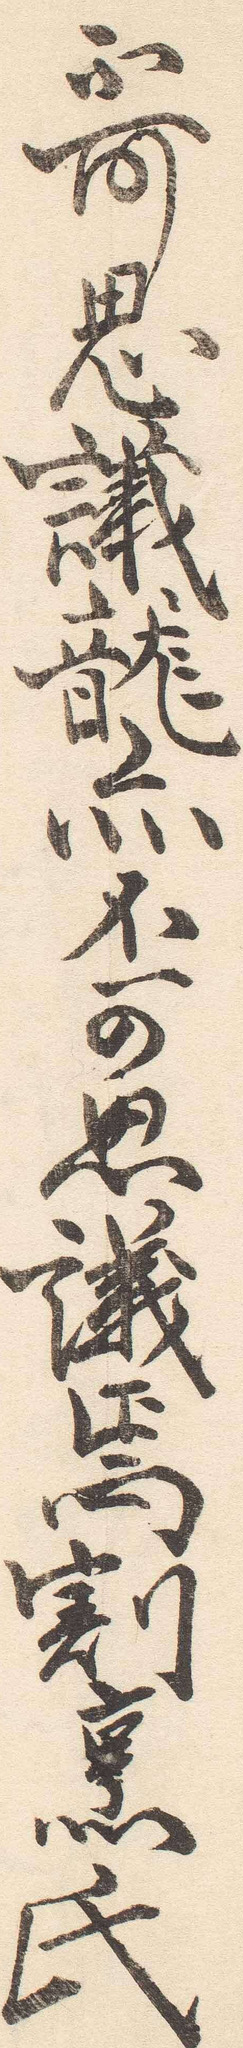不可思議龍亦不可思議焉割烹氏
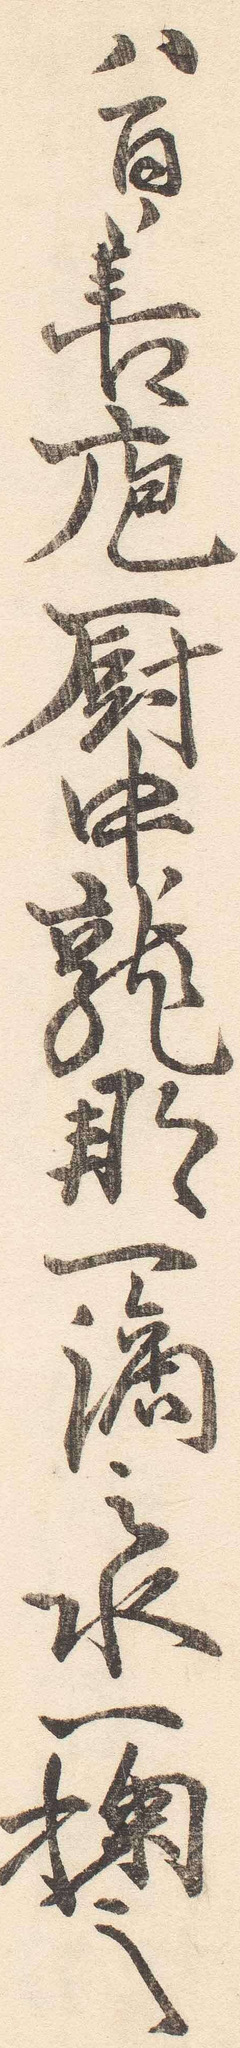八百善庖厨中龍耶一滴之水一掬之
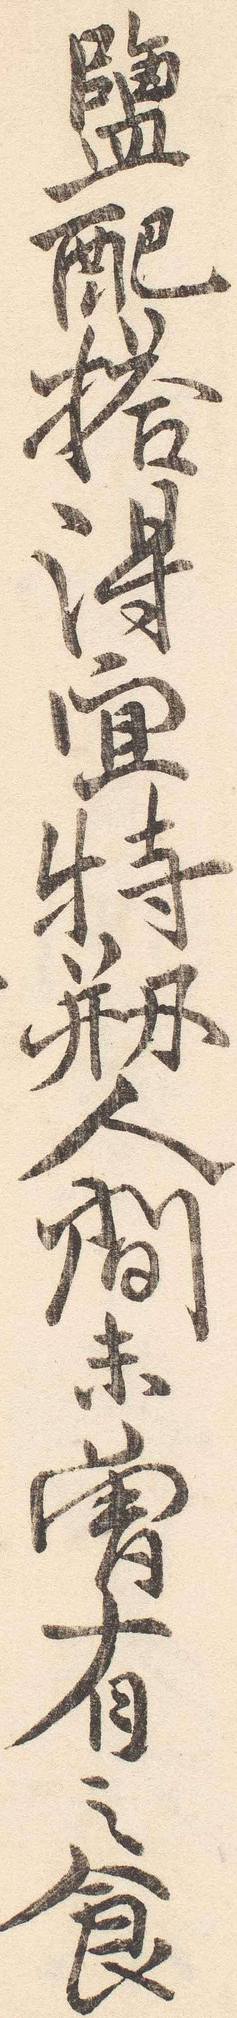塩配搭得宜特剏人間未曾有之食
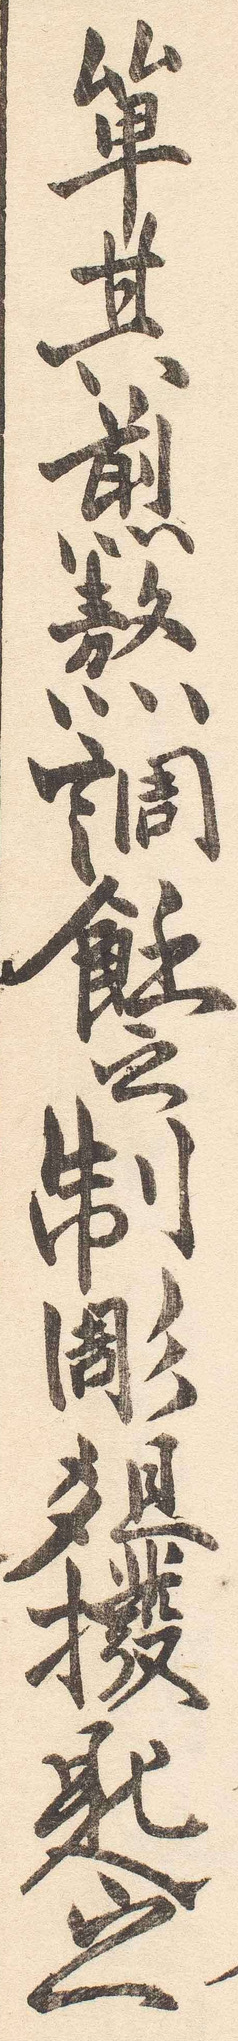單其煎熬調飪之制彫俎撥匙之
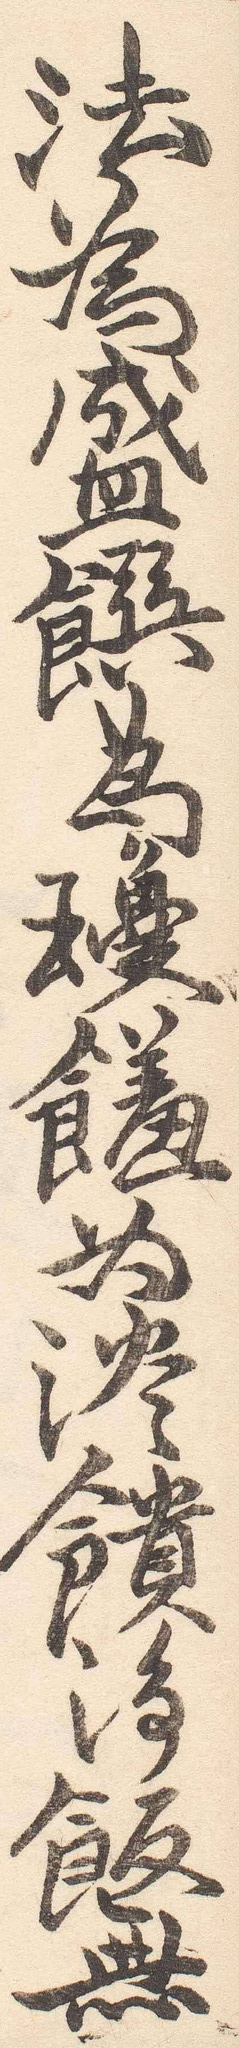法為盛饌為瓊饈為淡饋浄飯無
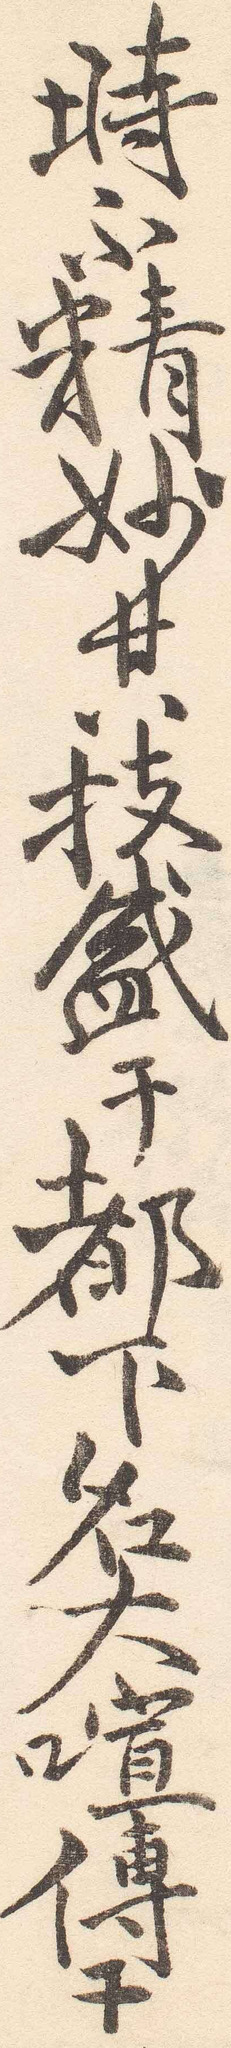時不精妙其技盛于都下名大喧伝于
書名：料理通
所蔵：東京学芸大学附属図書館 国文学研究資料館
